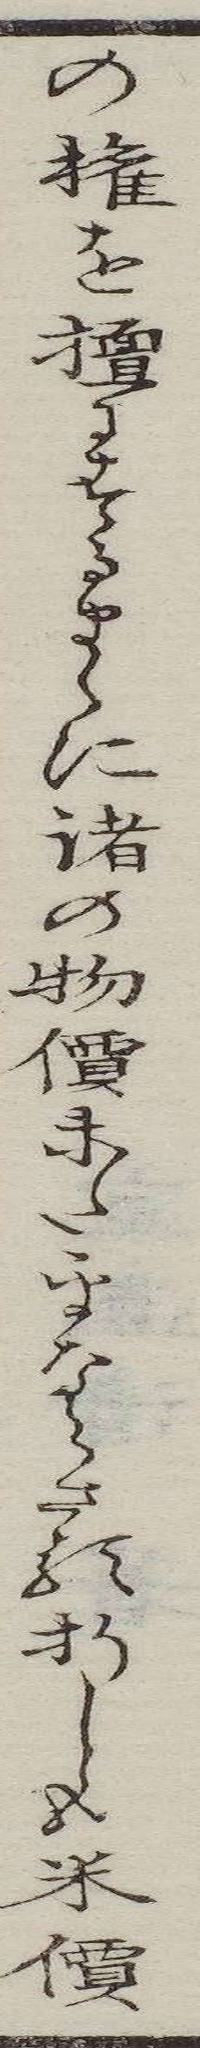の権を擅にするままに諸の物価未た平ならさる折しも米価
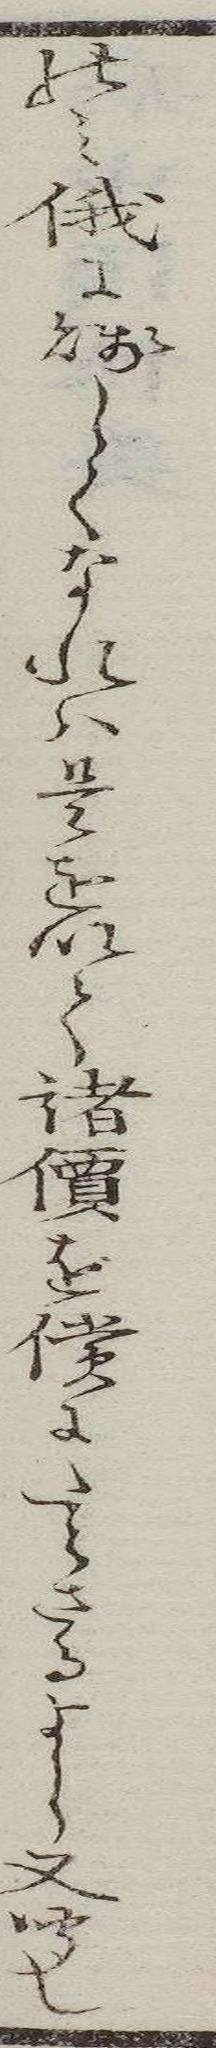のみ俄に賤しくなれは是を以て諸価を償にたらさるよし又聞し
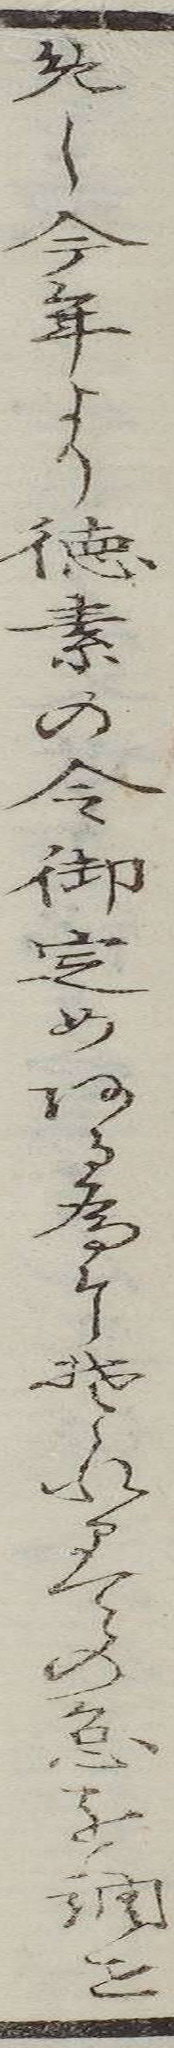めし今年より徳素の令御定めある為にそれまての怠を調せ
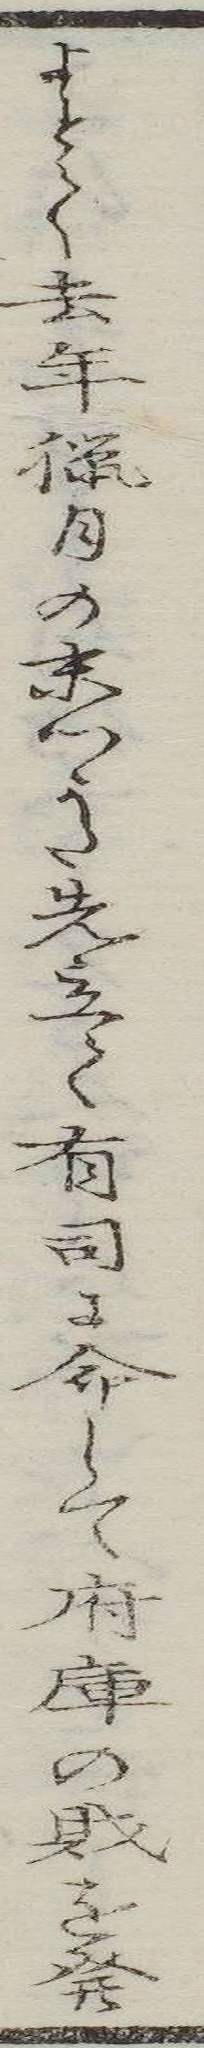よとて去年臘月の末つかた先立て有司に命して府庫の財を発
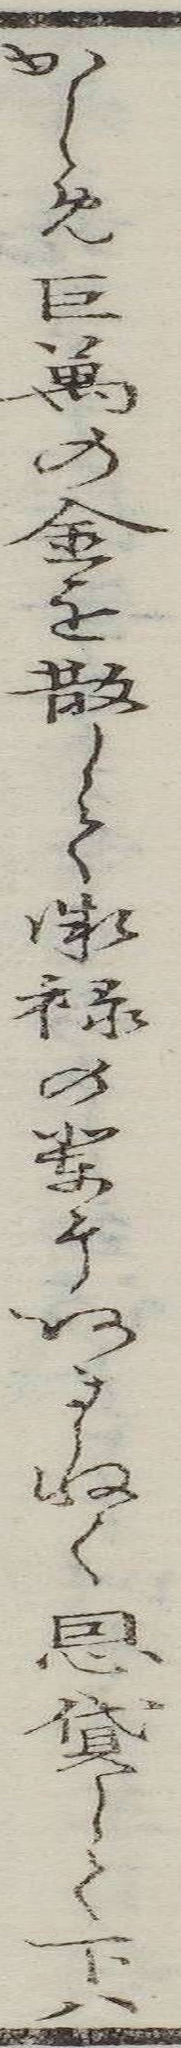かしめ巨萬の金を散して微禄の輩にあまねく恩貸して下は
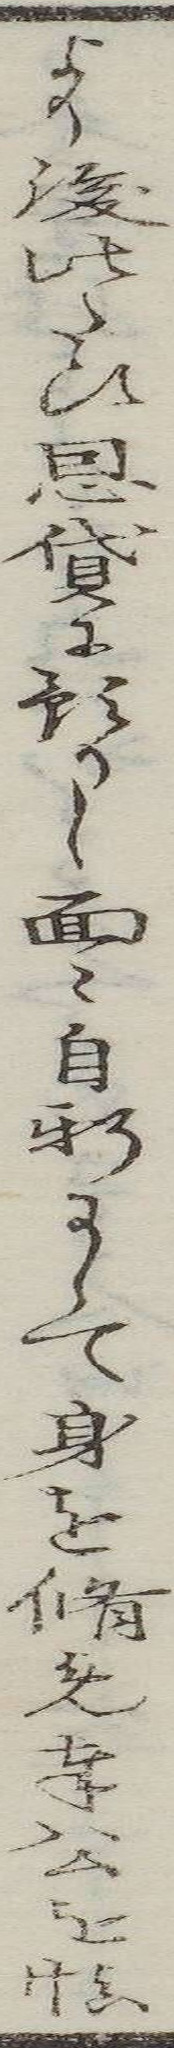より後此たひ恩貸に預りし面々自新にして身を脩め奉公を慎
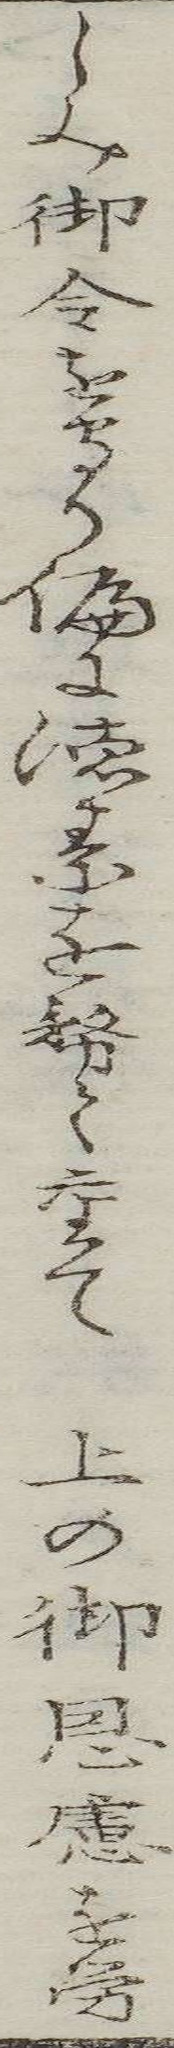しみ御令を守り偏に徳素を務て置て上の御恩慮を労
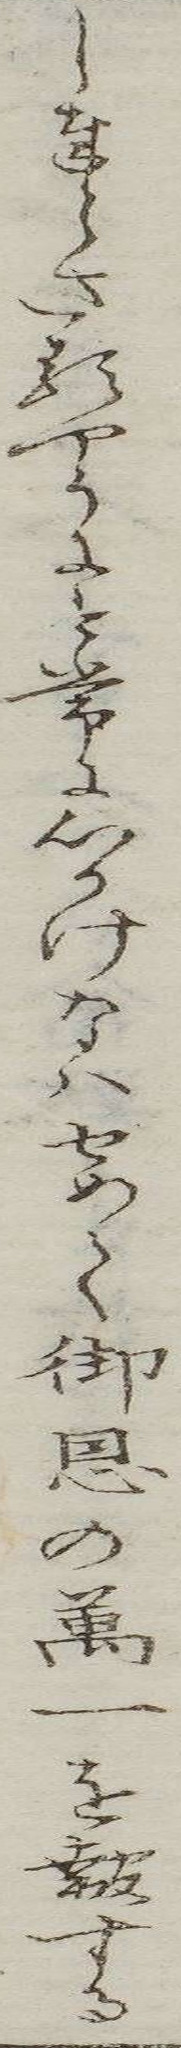し奉しさるやうまと常に心かけなはせめて御恩の萬一を報する
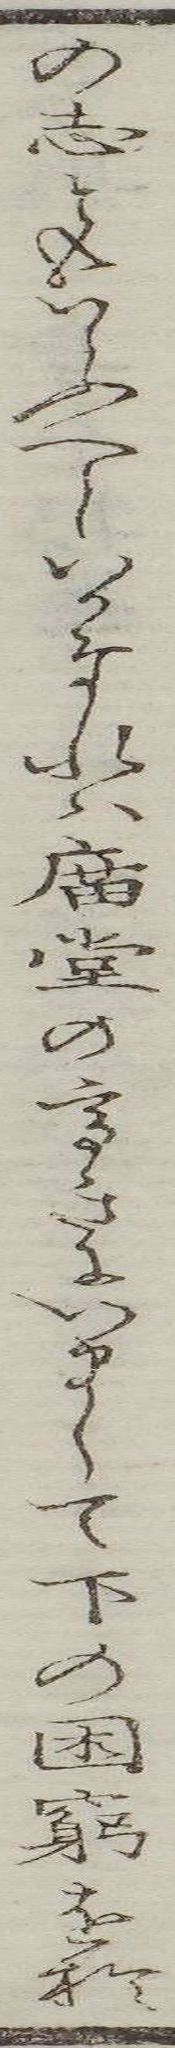の志ともいふへしいかなれは庵堂の高きにいまして下の困窮をお
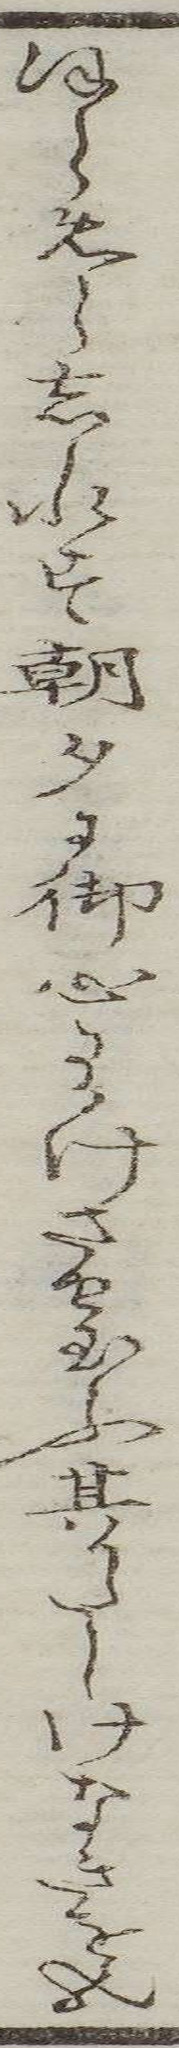ほしめし忘れず朝夕に御心にかけさせ玉ふ其かたしけなきをも

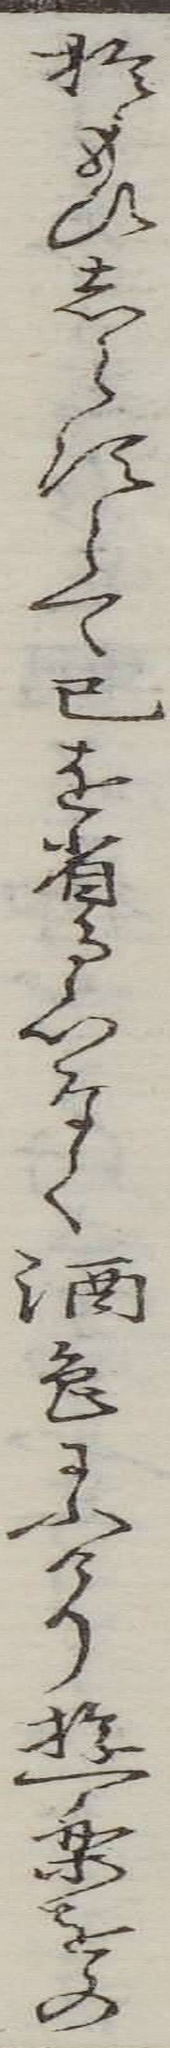おもひしらすして己を省る心なく酒色にふけり遊楽をの
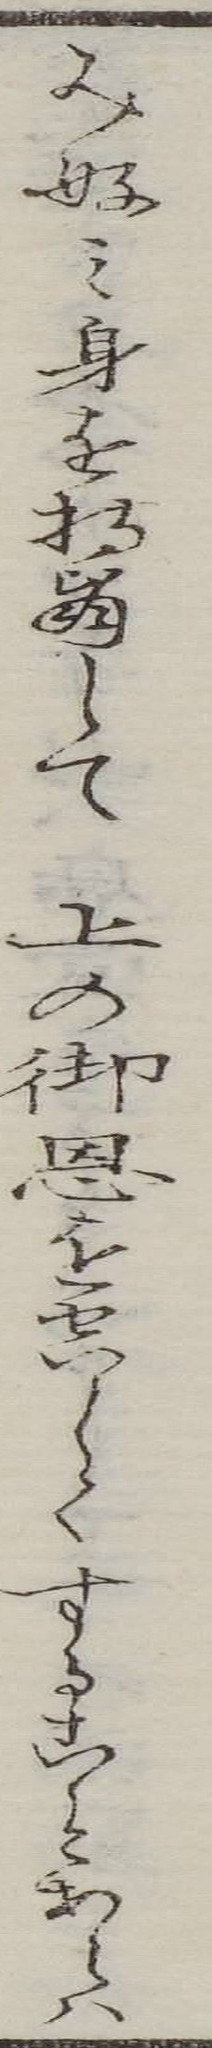み好み身を持崩して上の御恩を空しくすることあらは
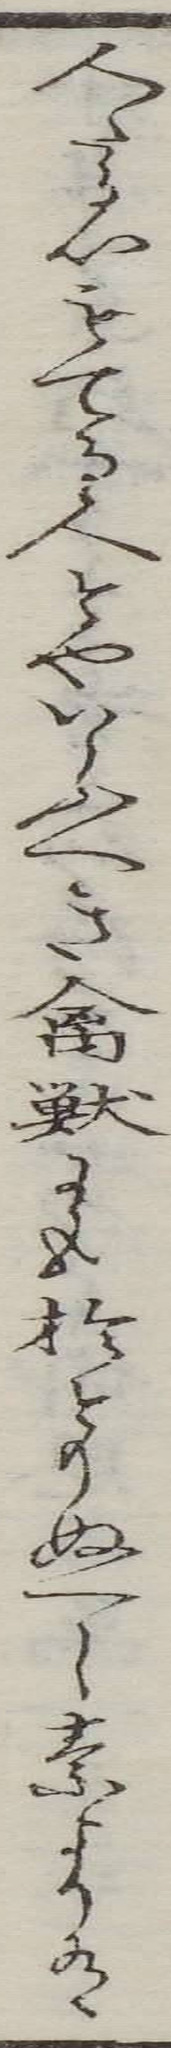人たる心もてる人とやいふへき禽獣にもおとりぬへし素より有
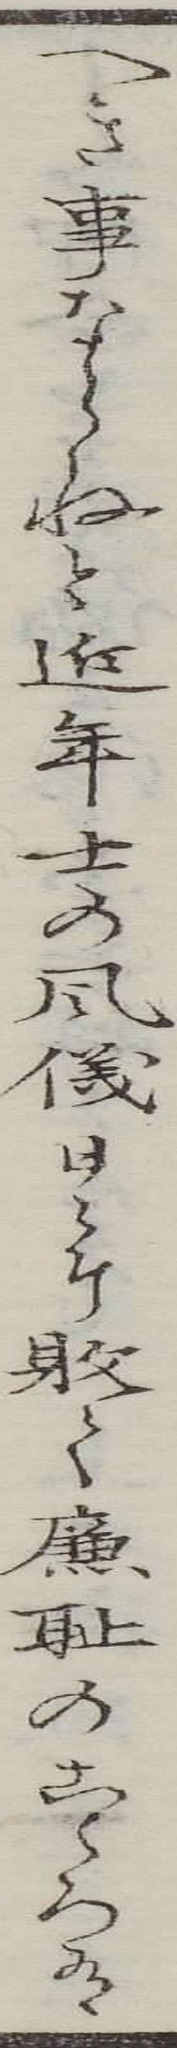へき事ならねど近年士の風儀日々に散て廉恥のこゝろ有
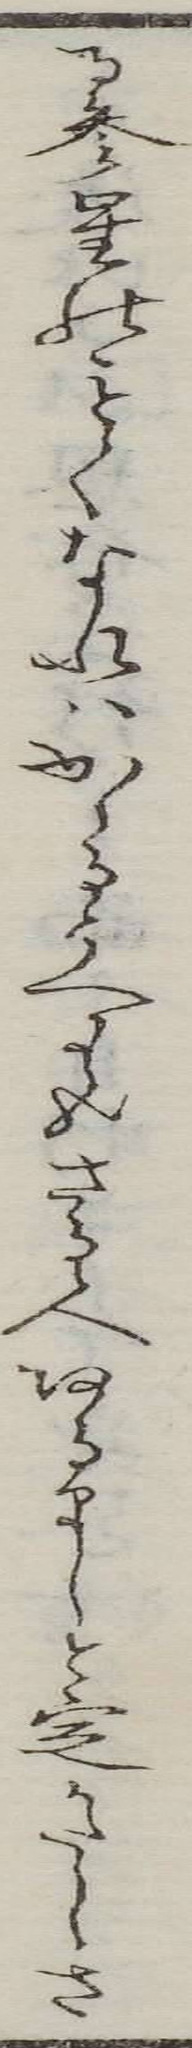る参星のことくなれはかゝるうへにもさる人あるましと定かたしさ
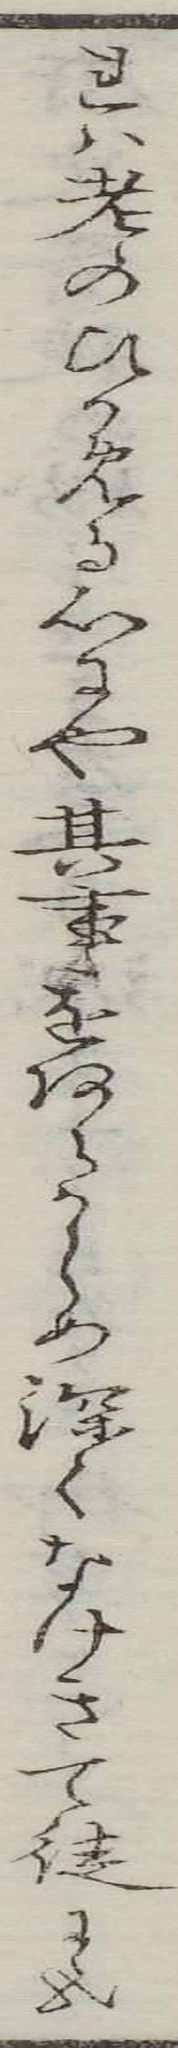れは老のひかめる心にや其事をあらかしめ深くなけきて徒にも
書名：病中須佐美
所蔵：国文学研究資料館
